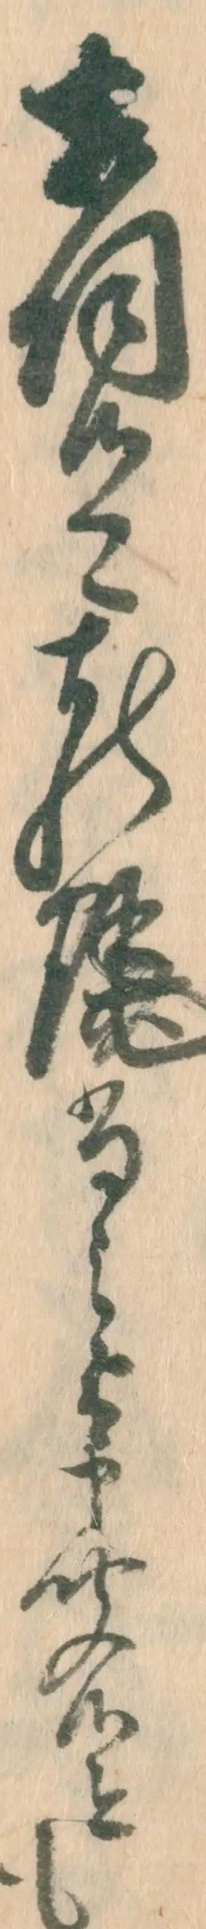相伺候ニ類焼当主と申聞候とも

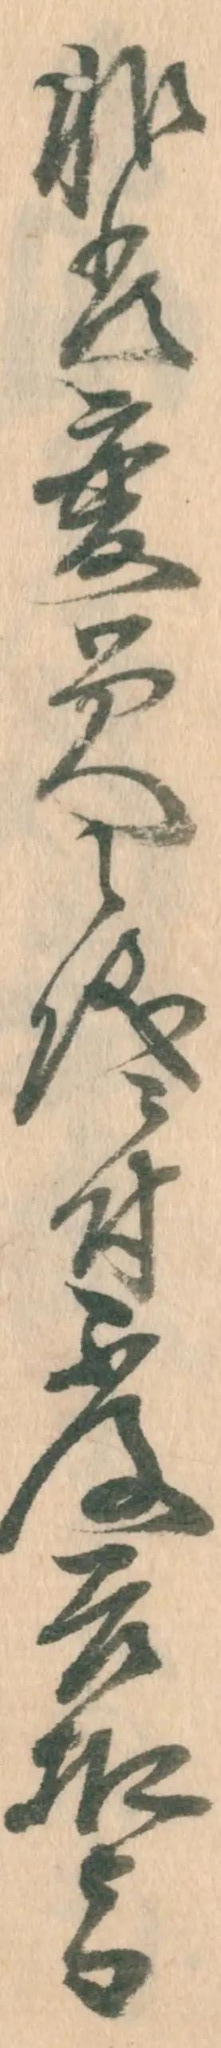非常変災之儀ニ付不及差控旨
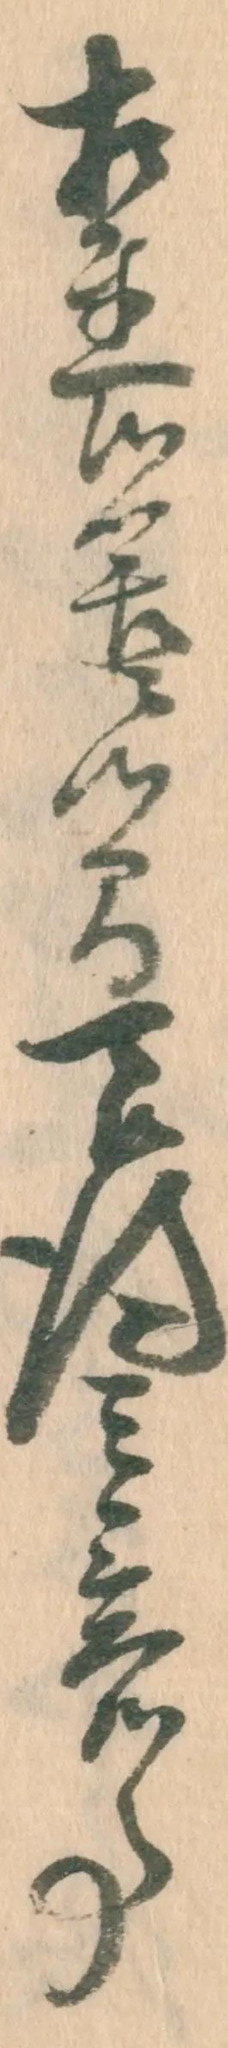相達候筈ニ候間可被得其意候事
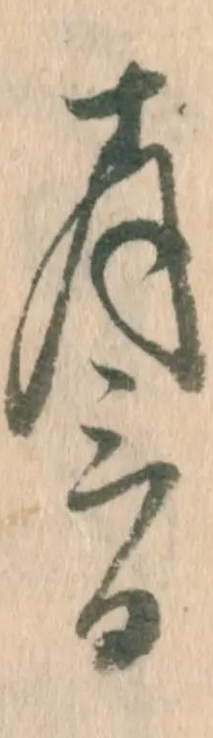十月三日
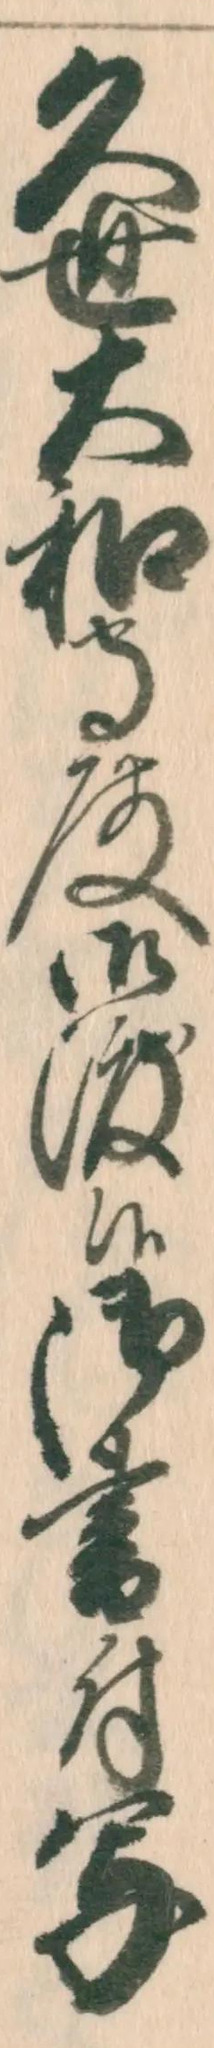││久世大和守殿御渡候御書付写
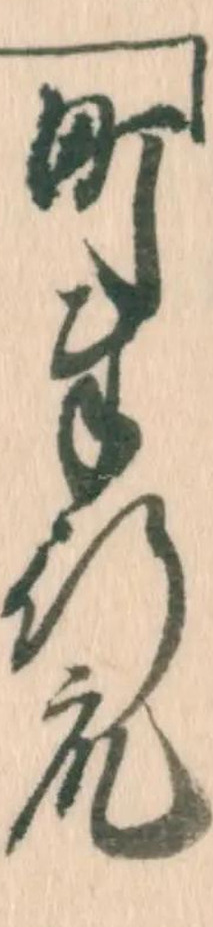││町奉行衆
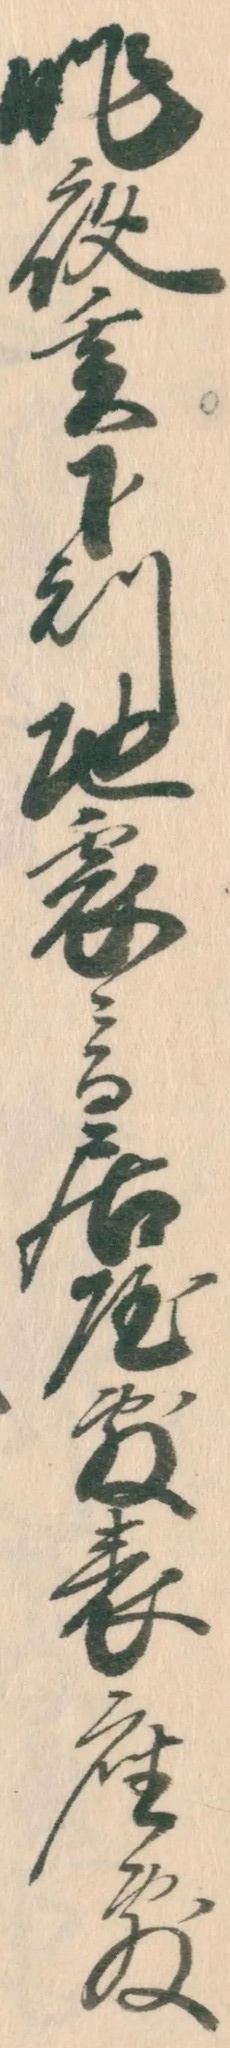昨夜亥下刻地震ニて居屋敷表座敷
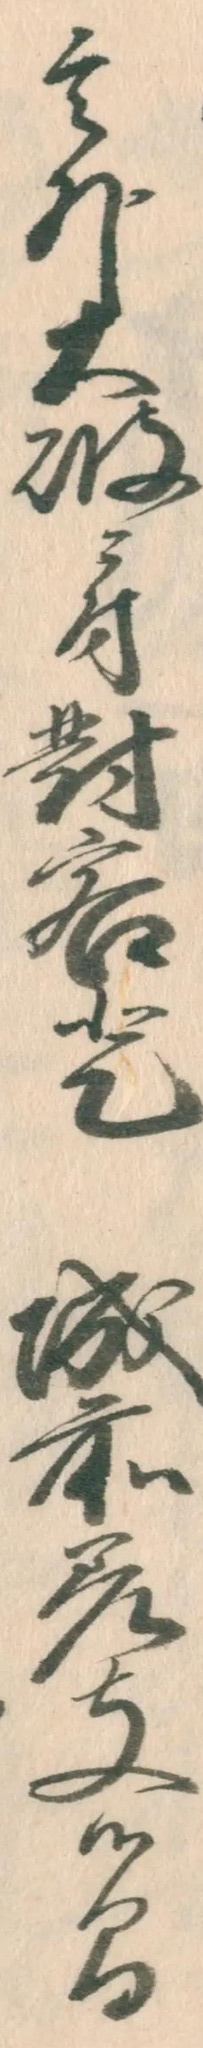其外大破ニ付対客登城前差支候間
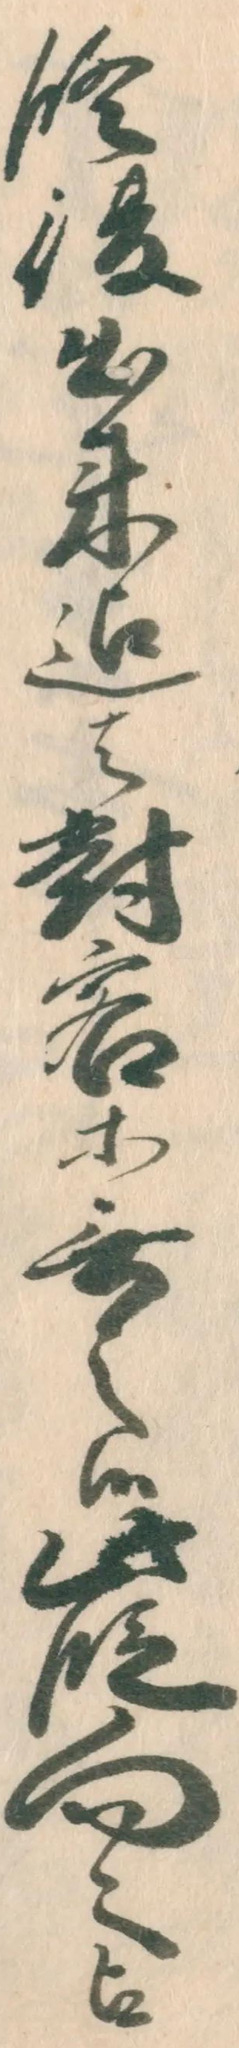修復出来迄は対客等無之候此段向〻え

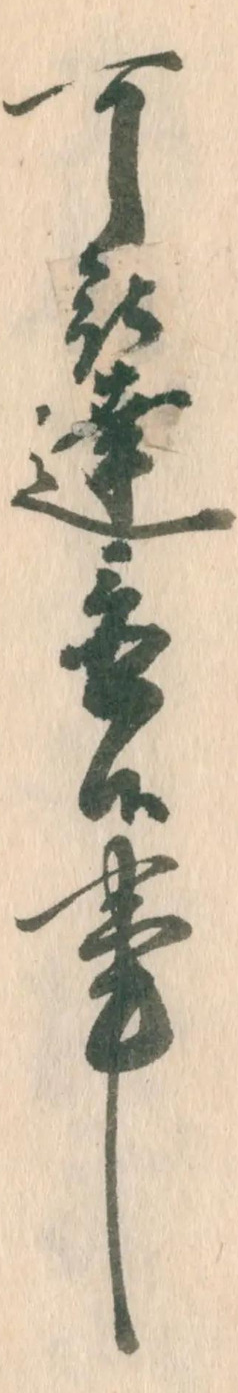可被達置事
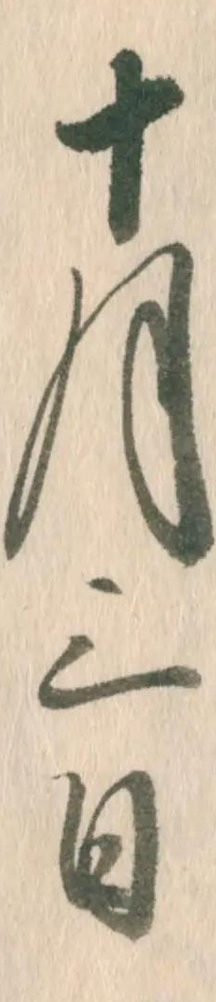十月三日
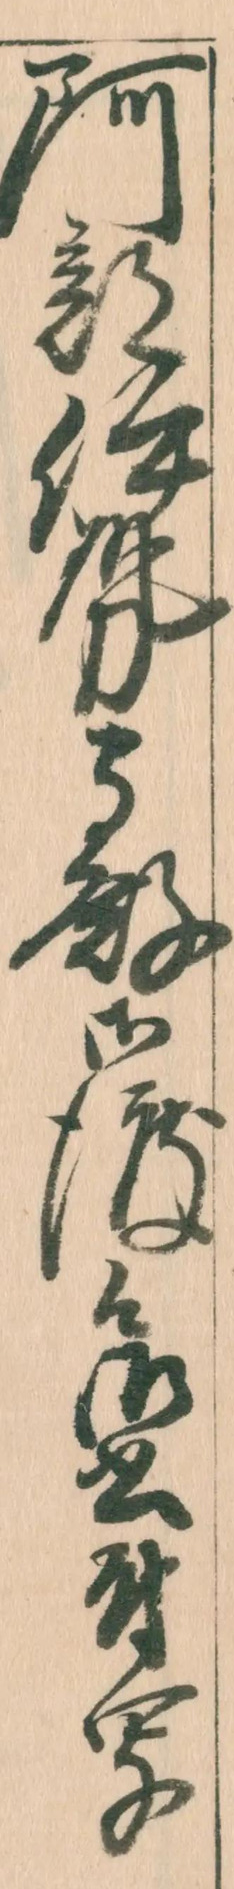│阿部伊㔟守殿御渡候御書付写
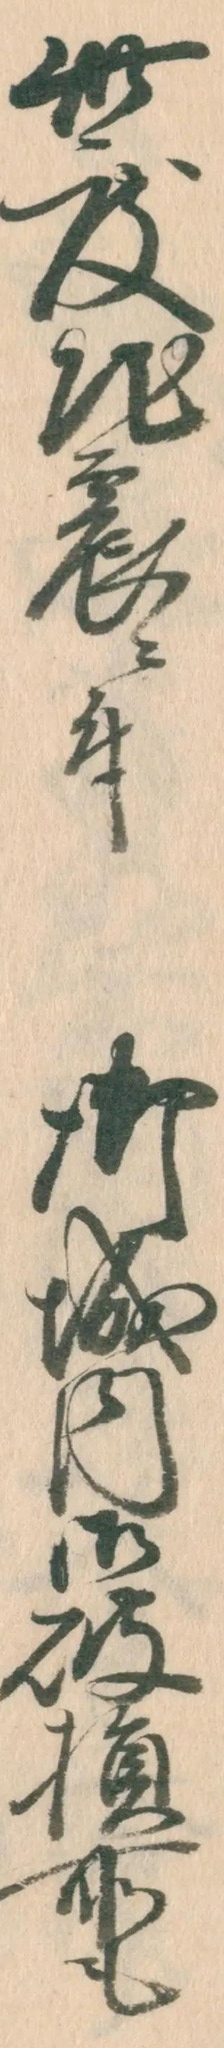此度地震ニ付御城内御破損所も
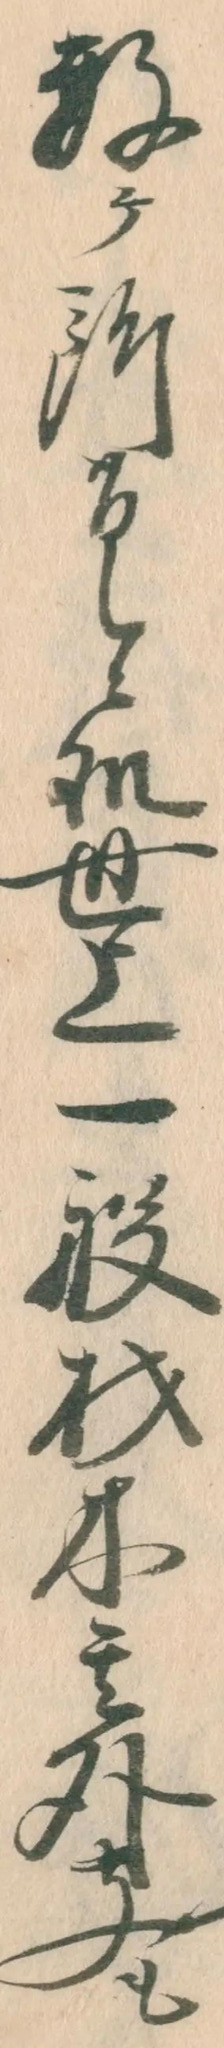数ケ所有之候処世上一般材木其外支も
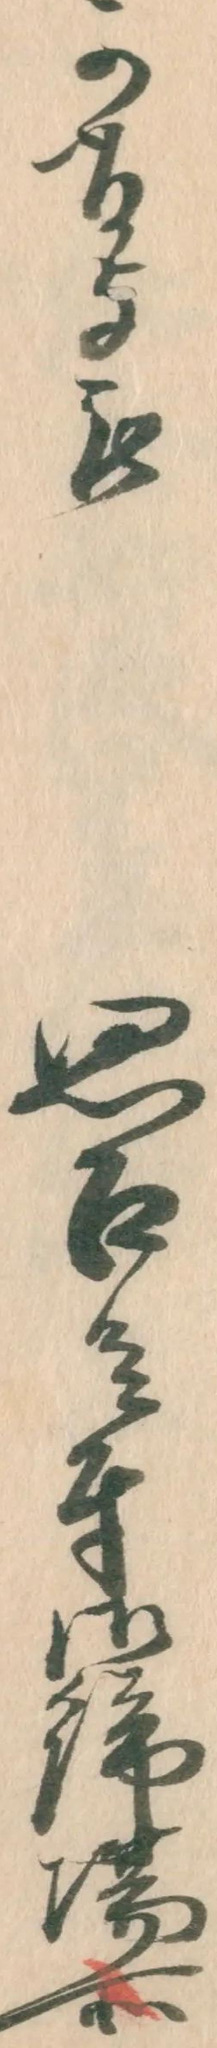可有と被思召候ニ付御締場所

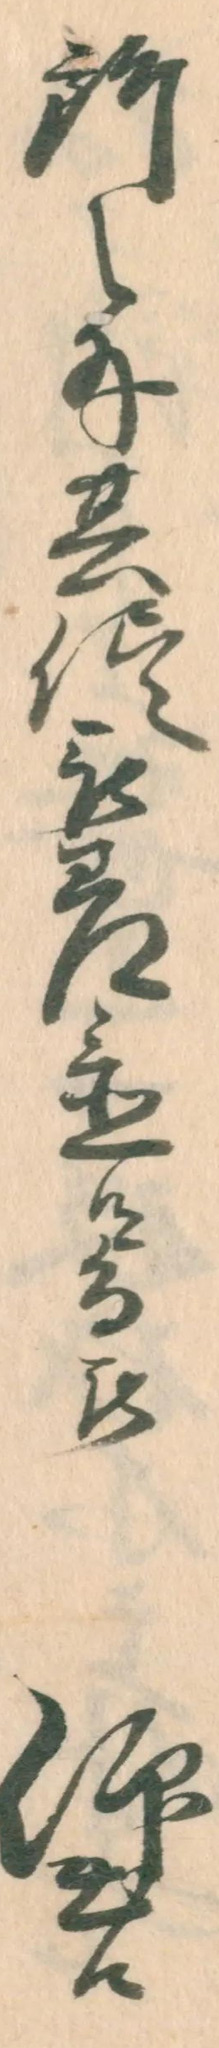所之外其儘被差置候旨被仰出候
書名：地震災書留 2巻. [2] 内表紙に「地震一件　安政二卯年十月」とあり
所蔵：国立国会図書館 National Diet Library, JAPAN
